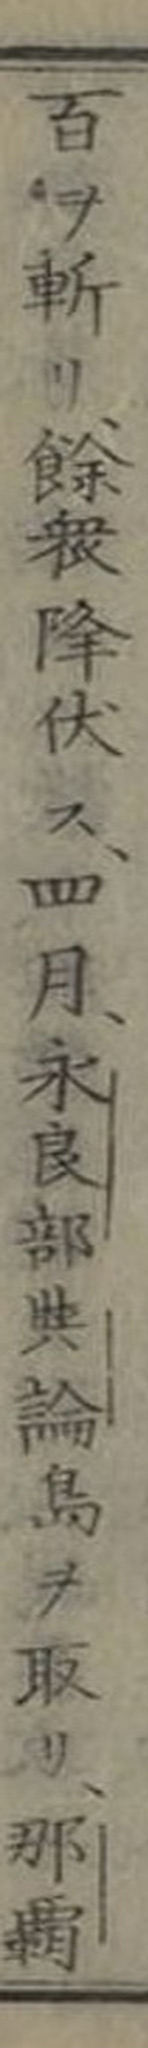百ヲ斬リ、余衆降伏ス、四月、永良部与論島ヲ取リ、那覇
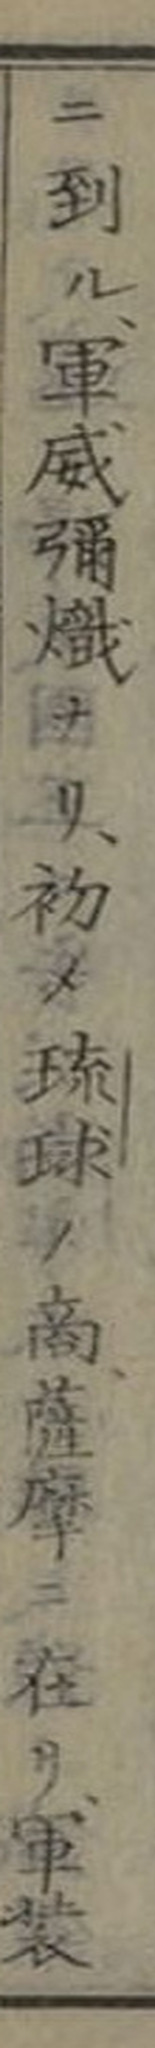ニ到ル、軍威弥熾ナリ、初メ琉球ノ商、薩摩ニ在リ、軍装

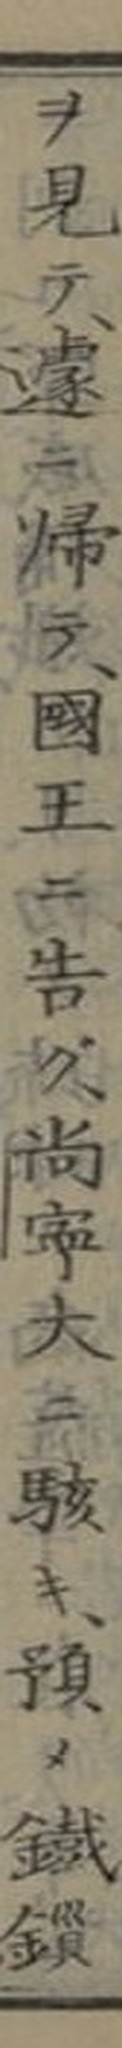ヲ見テ、遽ニ帰テ、国王ニ告グ、尚寧大ニ駭キ、預メ鉄鎖
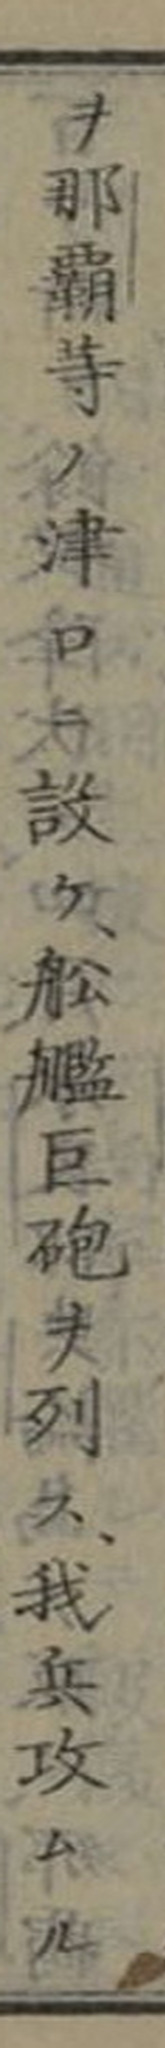ヲ那覇等ノ津口ニ設ケ、船艦巨砲ヲ列ス、我兵攻ムル
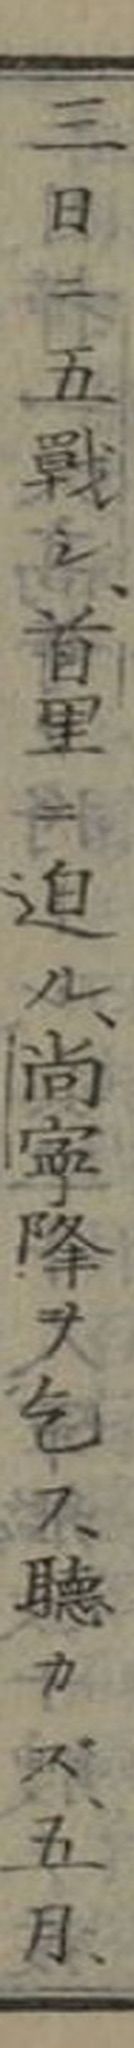三日ニ五戦シ、首里ニ迫ル、尚寧降ヲ乞フ、聴カズ、五月、
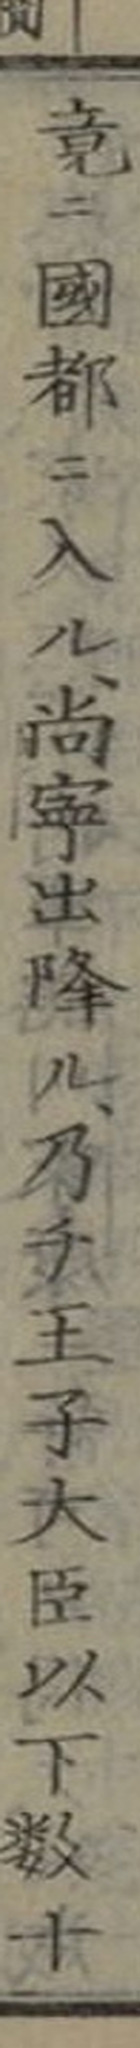竟ニ国都ニ入ル、尚寧出降ル、乃チ王子大臣以下数十
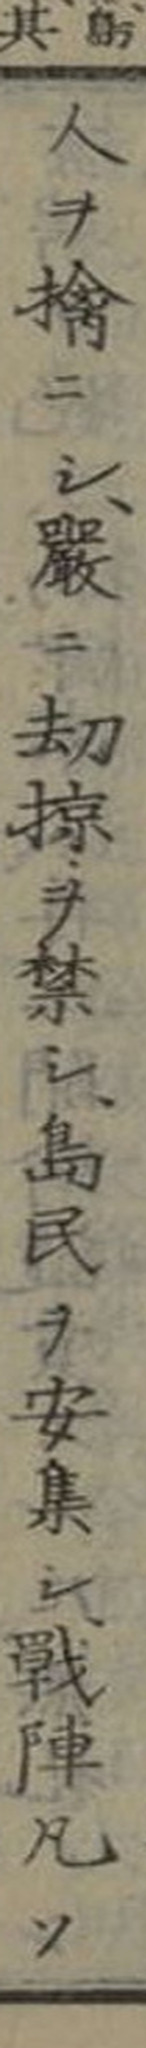人ヲ擒ニシ、厳ニ劫掠ヲ禁シ、島民ヲ安集シ、戦陣凡ソ
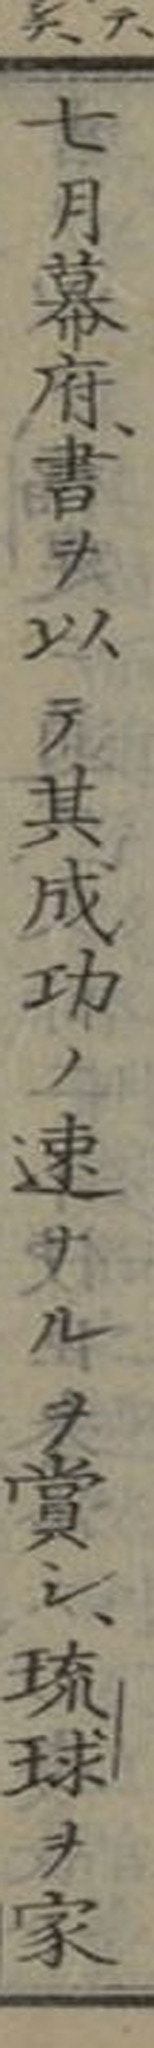七月幕府、書ヲ以テ其成功ノ速ナルヲ賞シ、琉球ヲ家
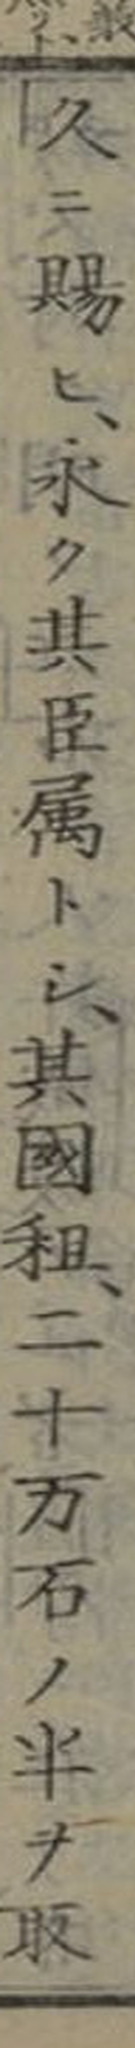久ニ賜ヒ、永ク其臣属トシ、其国租、二十万石ノ半ヲ取
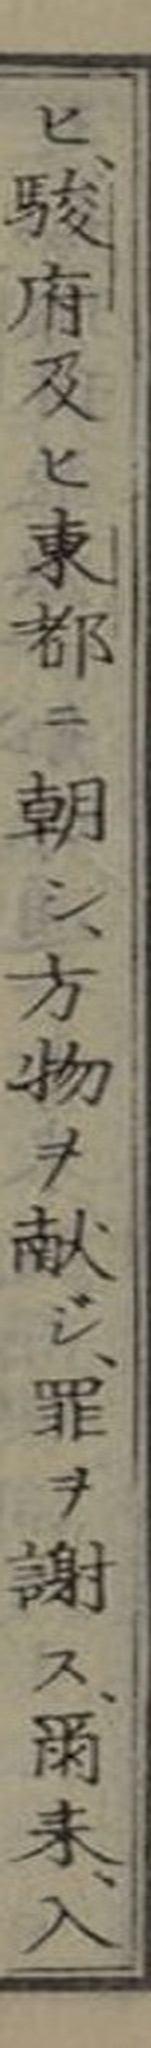ヒ、駿府及ヒ東都ニ朝シ、方物ヲ献ジ、罪ヲ謝ス、爾来、入
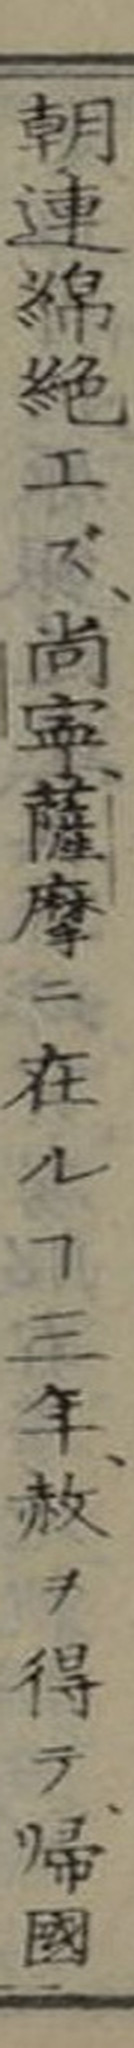朝連綿絶エズ、尚寧薩摩ニ在ルヿ三年、赦ヲ得テ、帰国
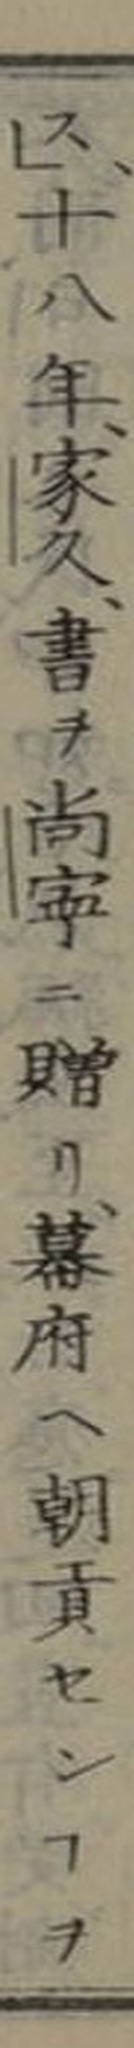ス、」十八年、家久、書ヲ尚寧ニ贈リ、幕府ヘ朝貢センヿヲ
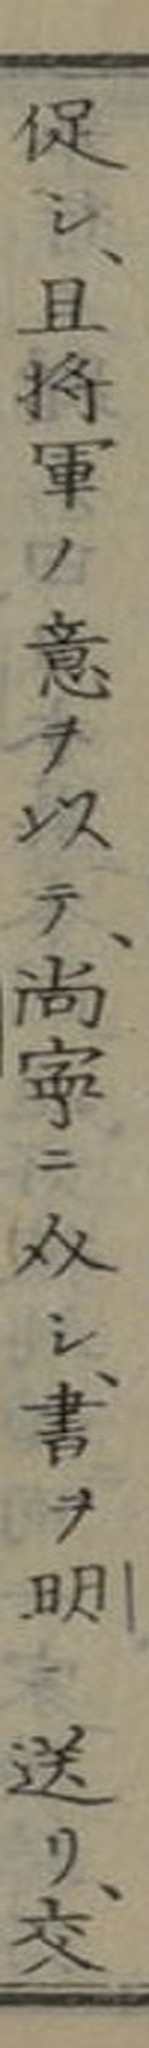促シ、且将軍ノ意ヲ以テ、尚寧ニ介シ、書ヲ明ニ送リ、交
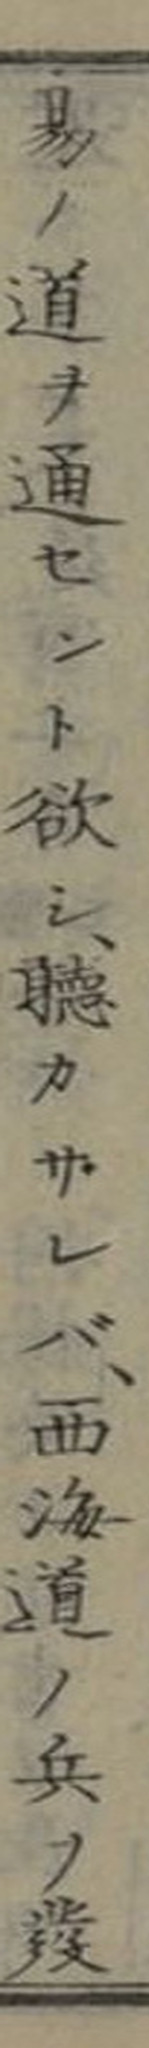易ノ道ヲ通セント欲シ、聴カザレバ、西海道ノ兵ヲ発
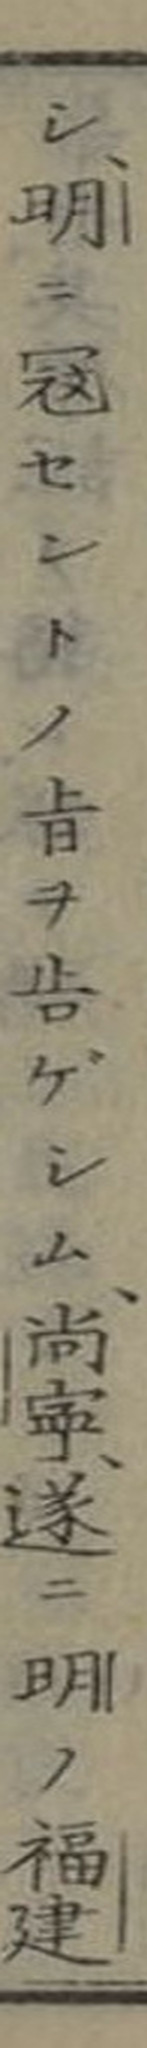シ、明ニ寇セントノ旨ヲ告ゲシム、尚寧、遂ニ明ノ福建
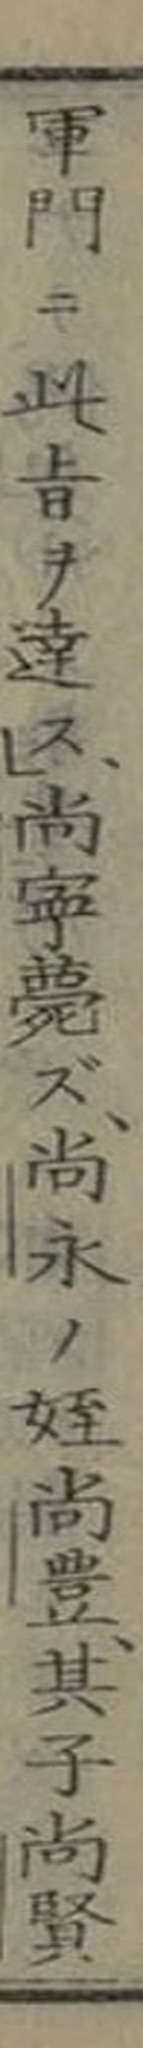軍門ニ此旨ヲ達ス、」尚寧薨ズ、尚永ノ姪尚豊、其子尚賢
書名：琉球新誌 図附 上
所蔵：University of the Ryukyus Library
